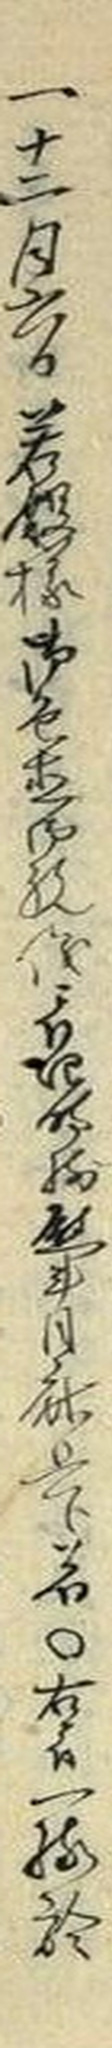一十二月六日若殿様御色直御祝儀ニ付四時揃熨斗目麻上下着〇右ニ付一統於
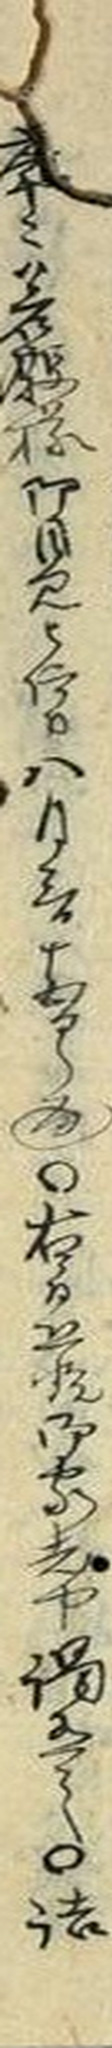席々若殿様御目見被仰付八月三日十五日之通〇右ニ付恐悦御家老中謁有之〇詰
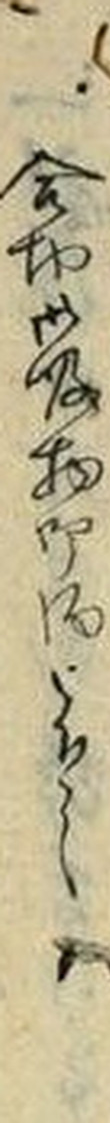合切御吸物御酒被下之

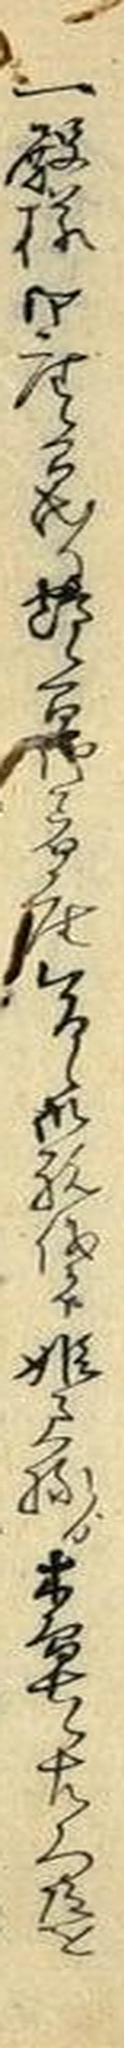一殿様御座之間代り鶴之間御着座今日之御祝儀ニ付姫君様ゟ本曽七郎右衛門殿を
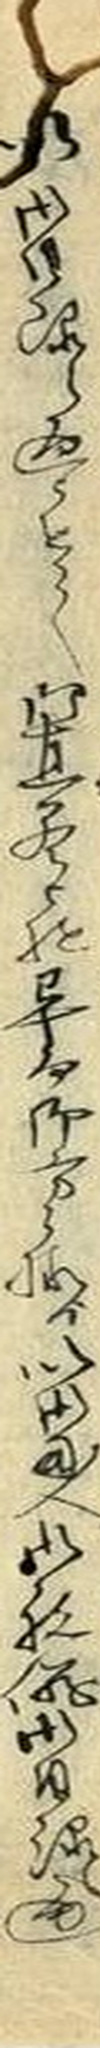以御目録之通被進之御直答被遊畢而御方々様ゟ御用人御祝儀御目録之通
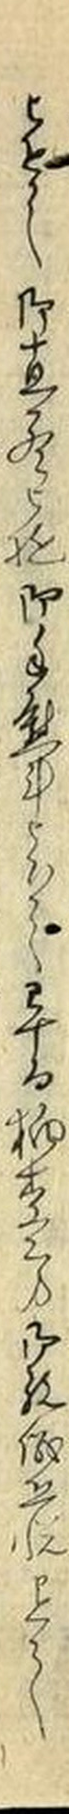被進之御直答被遊御手熨斗被下之畢而狛木工方御祝儀恐悦申上之
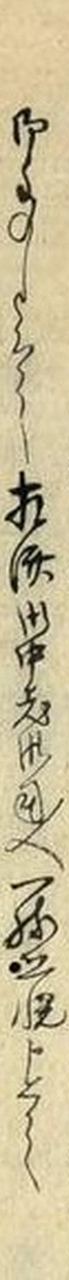御手のし被下之相済御中老御用人一統恐悦申上之
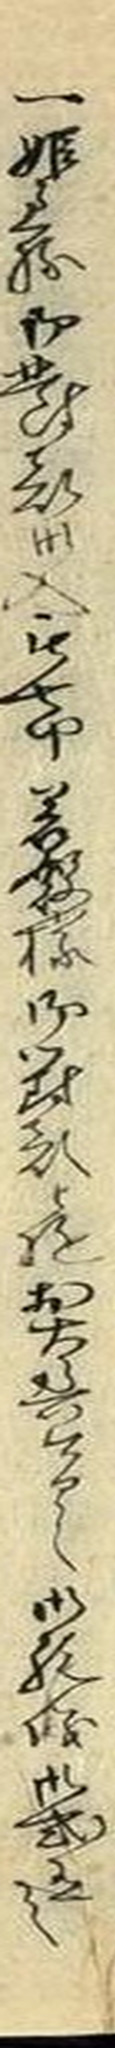一姫君様御対顔御入其節若殿様御対顔被遊於大奥今日之御祝儀御式有之
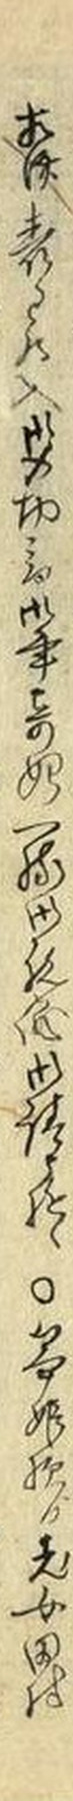相済表へ被為入御〆切ニ而御年寄始一統御祝儀御請被遊候〇箏姫様ゟ老女田村
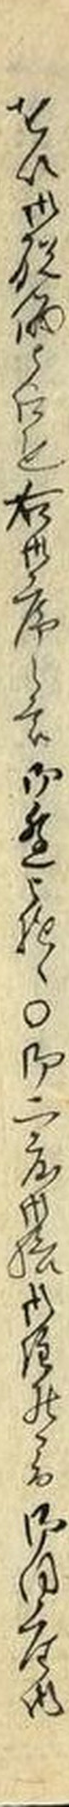を以御祝儀被仰進右御序之節御逢被遊候〇御二度御膳御住居ニ而御同座御
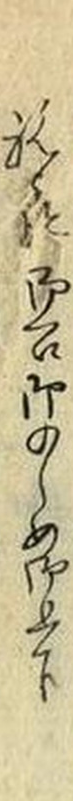祝被遊御召御のしめ御上下
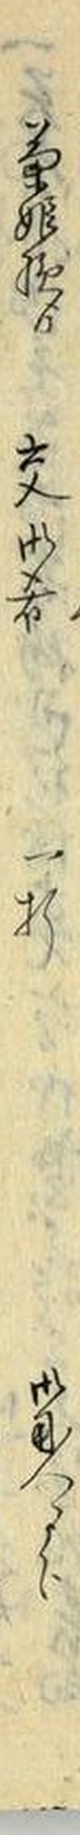菊姫様ゟ交御肴一折御側向一統へ被下
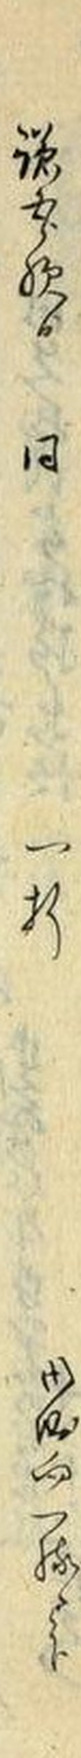謙五郎様ゟ同一折御用人へ被下
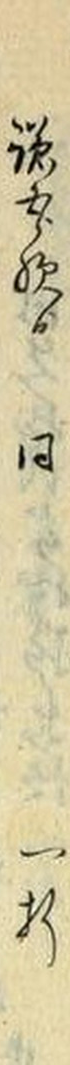貞照院様ゟ同一折
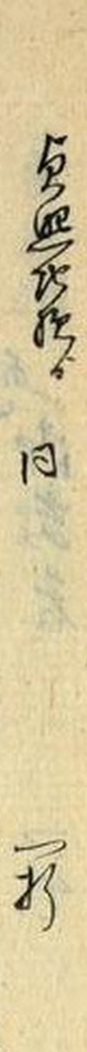貞照院様ゟ同一折
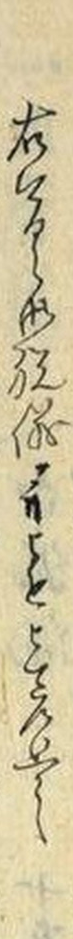右今日之御祝儀ニ付被進被差上之
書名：少傅日録抄（斉承付側向頭取日記、在府）
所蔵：福井県文書館 Fukui Prefectural Archives
